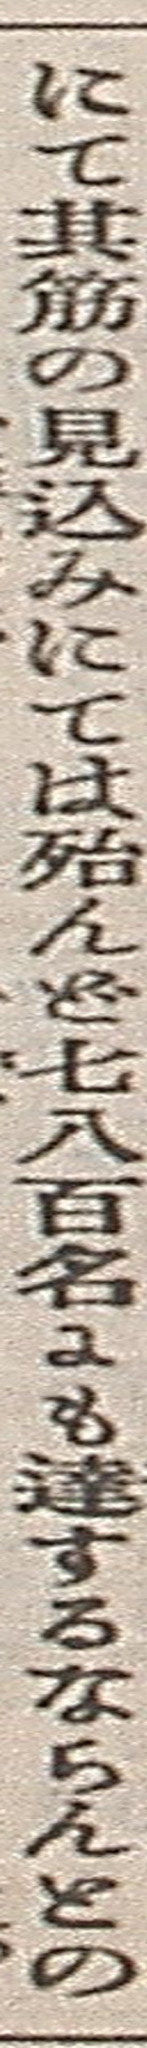にて其筋の見込みにては殆んど七八百名にも達するならんとの
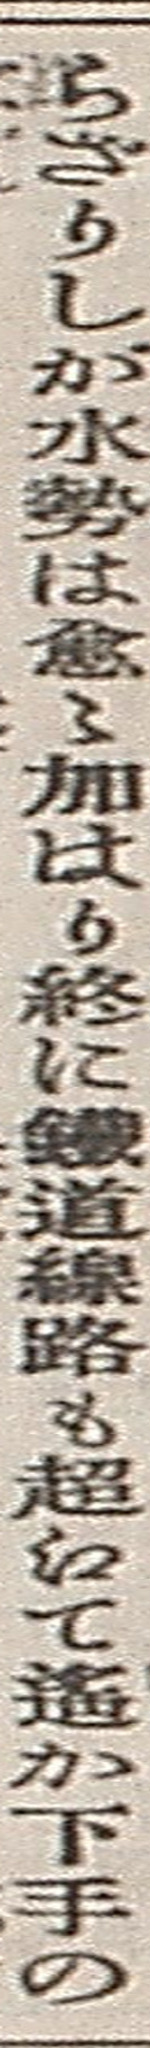らざりしが水勢は愈々加はり終に鉄道線路も超えて遥か下手の
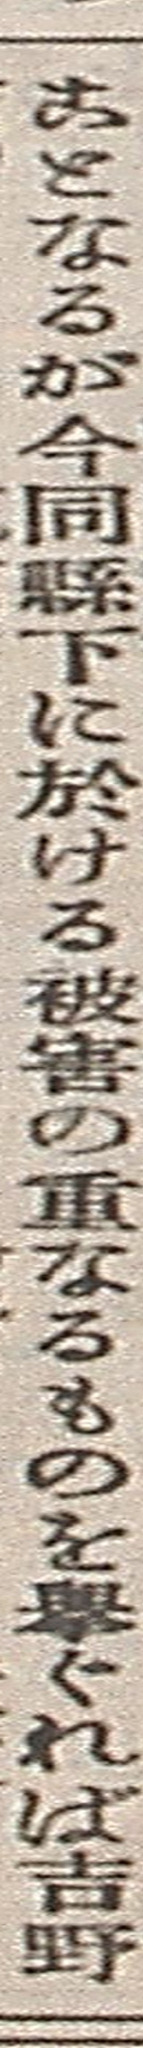ことなるが今同縣下に於ける被害の重なるものを挙ぐれば吉野
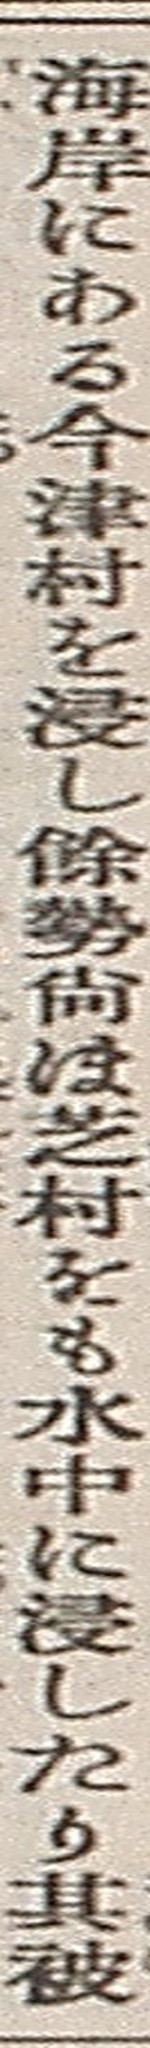海岸にある今津村を浸し餘勢尚ほ芝村をも水中に浸したり其被
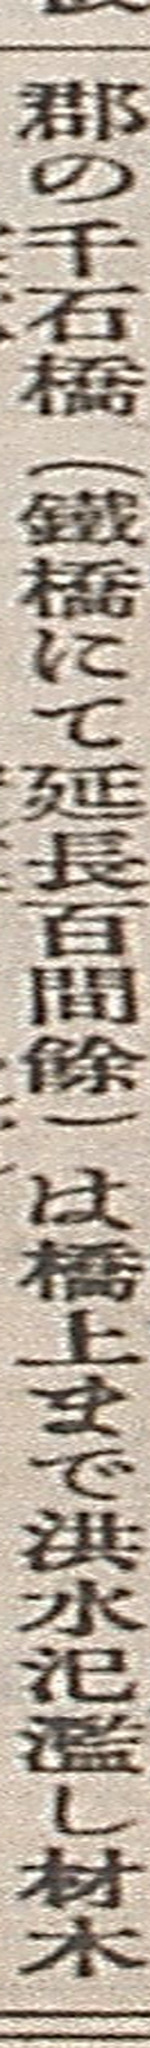郡の千石橋にて延長百間餘）は橋上まで洪水氾濫はし材木
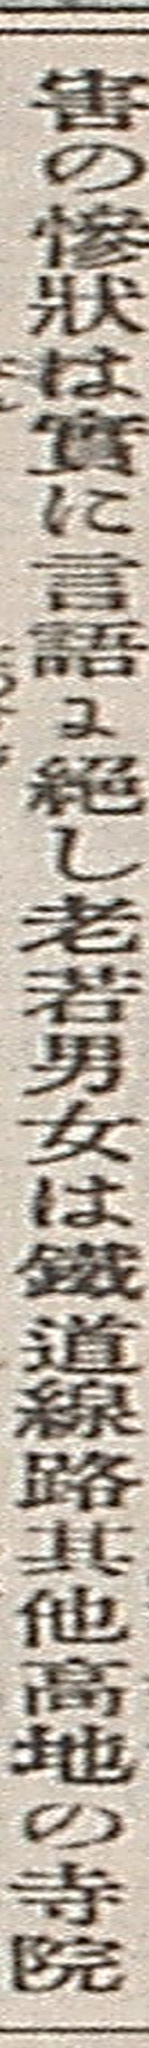害の惨状は実に言語に絶し老若男女は鉄道線路其他高地の寺院
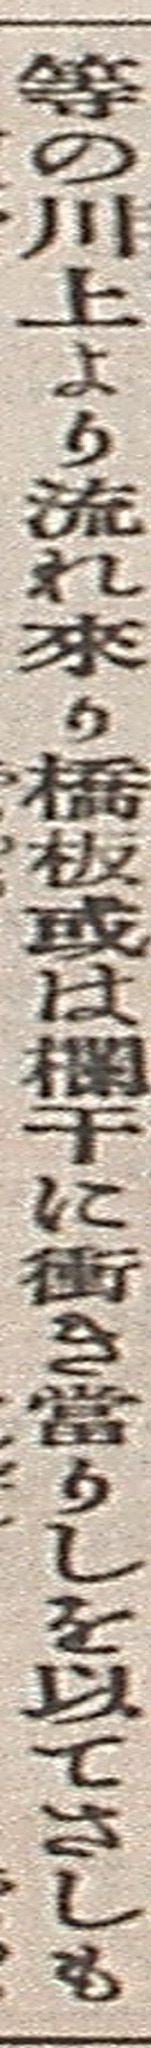等の川上より流れ来り橋板或は欄干に衝き当りしを以てさしも
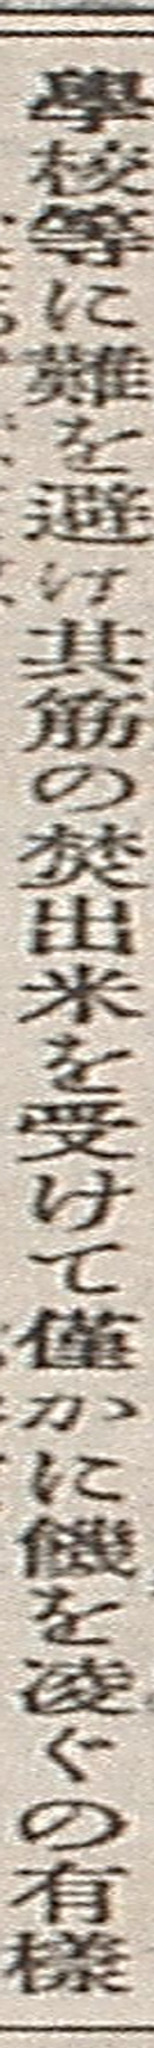學校等に難を避け其筋の焚出米を受けて僅かに餓を凌ぐの有様
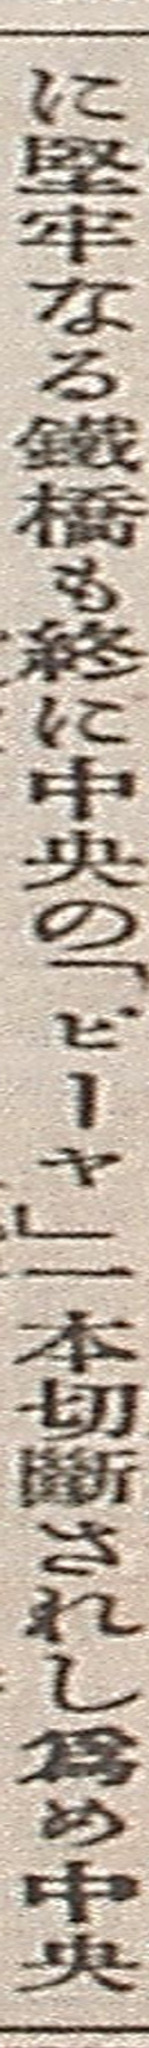に堅牢なる鉄橋も終に中央の[ピーヤ」一本切断されし為め中央
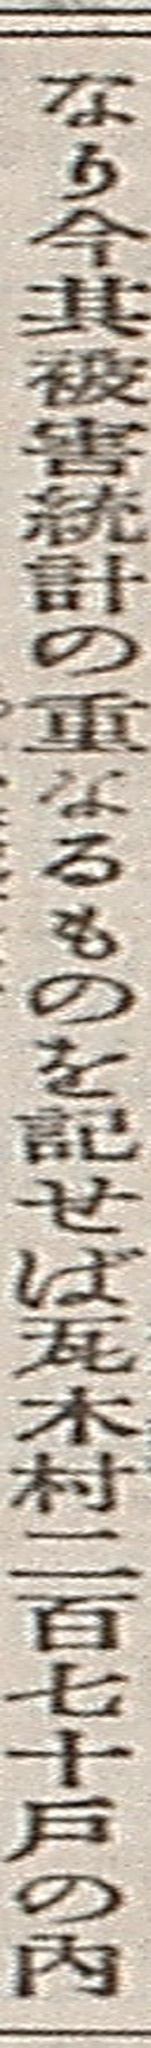なり今其被害統計の重なるものを記せば瓦木村二百七十戸の内
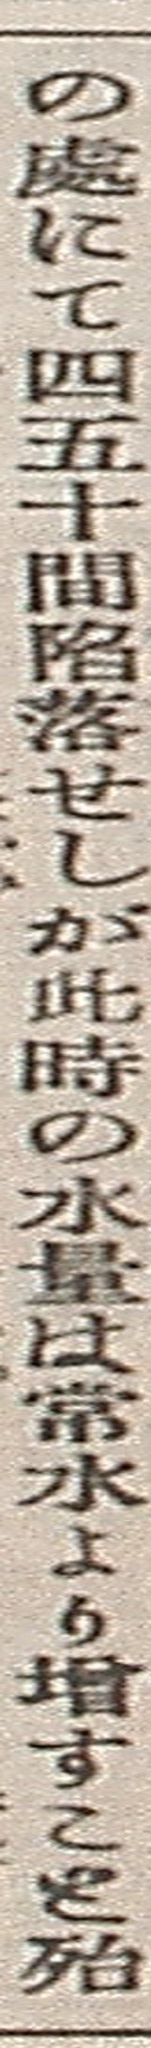の処にて四五十間陥落せしが此時の水量は常水より増すこと殆
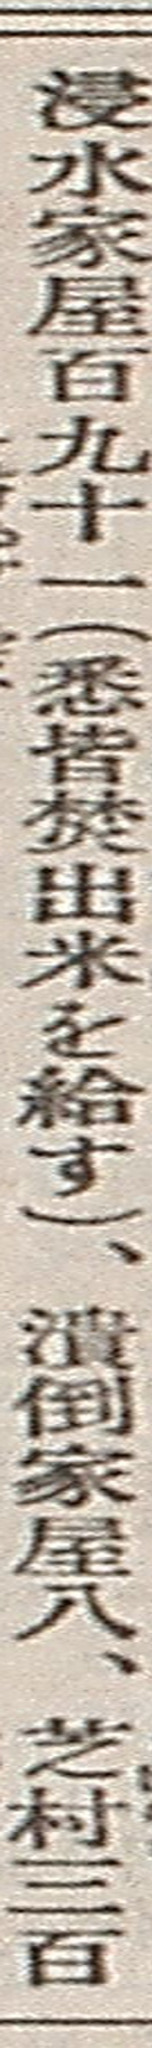浸水家屋百九十一を給す）、潰倒家屋八、芝村三百
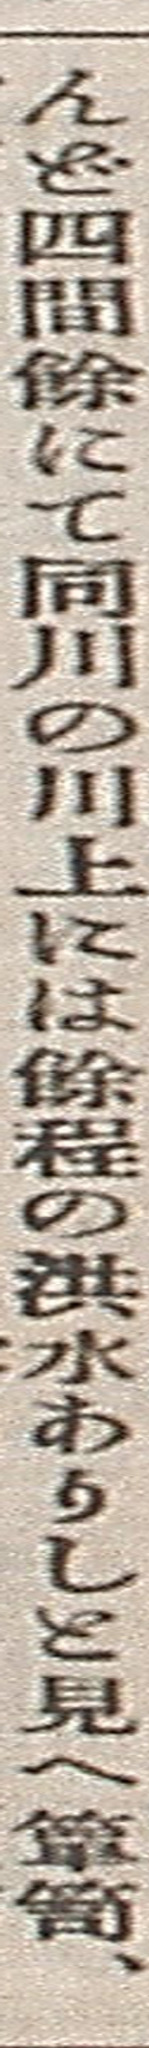んど四間餘にて同川の川上には余程の洪水ありしと見へ箪笥、
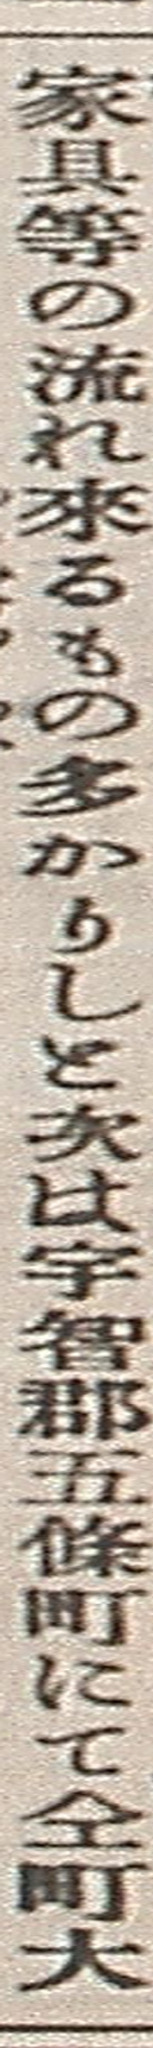家具等の流れ来るもの多かりしと次は宇智郡五條町にて同町大
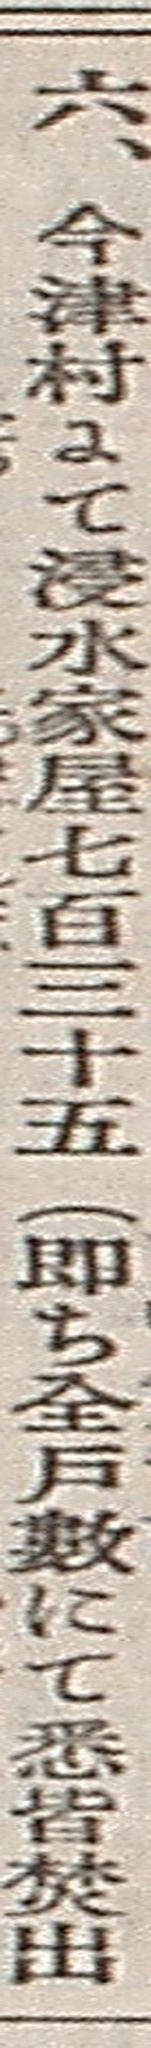六、今津村にて浸水家屋七百三十五ち全戸数にて悉皆焚出
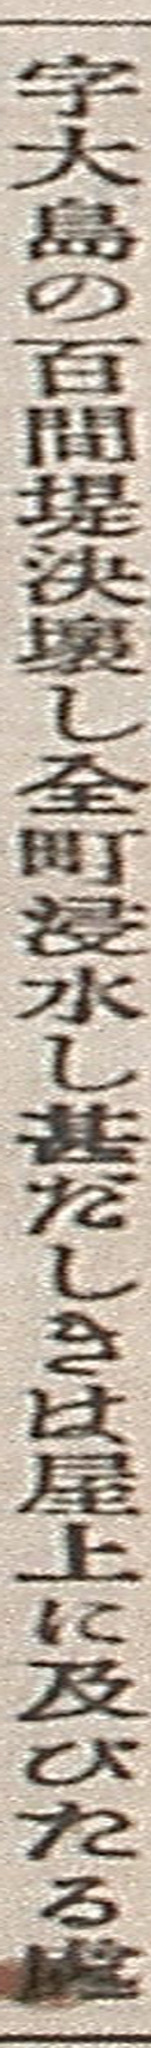字大島の百間堤決壊し全町浸水し甚だしきは屋上に及びたる処
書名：風俗畫報臨時増刊第百二十八號　洪水被害録（下）
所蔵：東京大学地震研究所図書室 Earthquake Research Institute Library, The University of Tokyo, JAPAN
